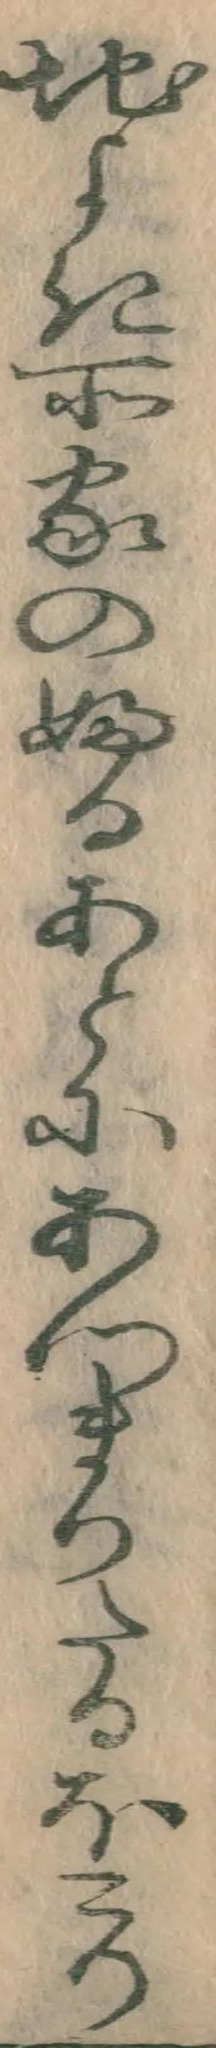地よき所家のふるあとにあつまりたるほこり
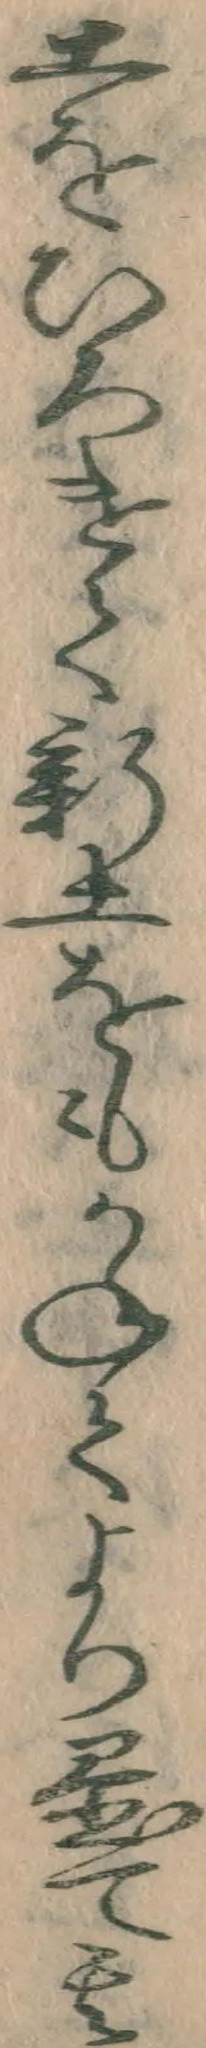土をひろけて新土をもかねてより置て其
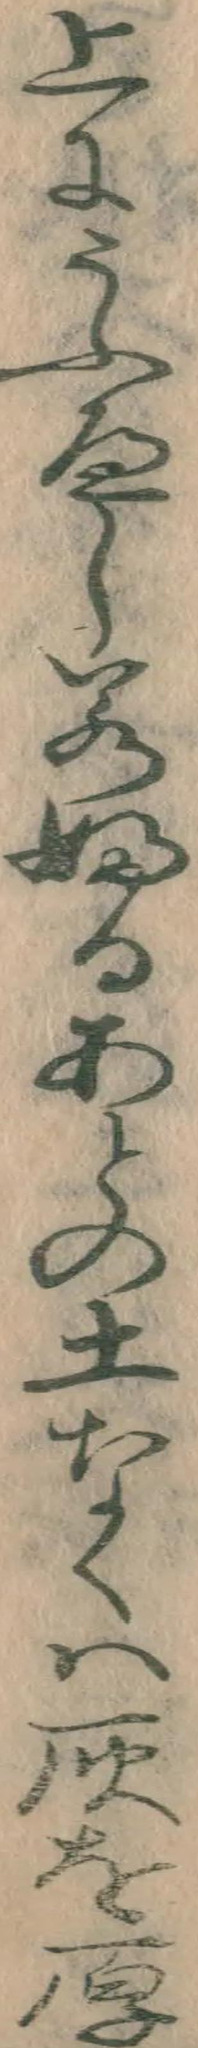上にうふへし若ふるあとの土なくは灰を厚
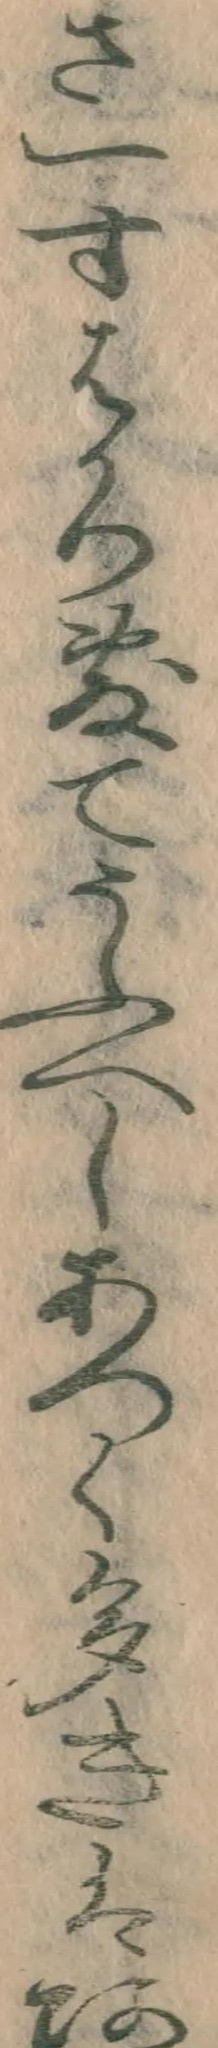さ一寸はかり敷てうふへしあつく多きはあ
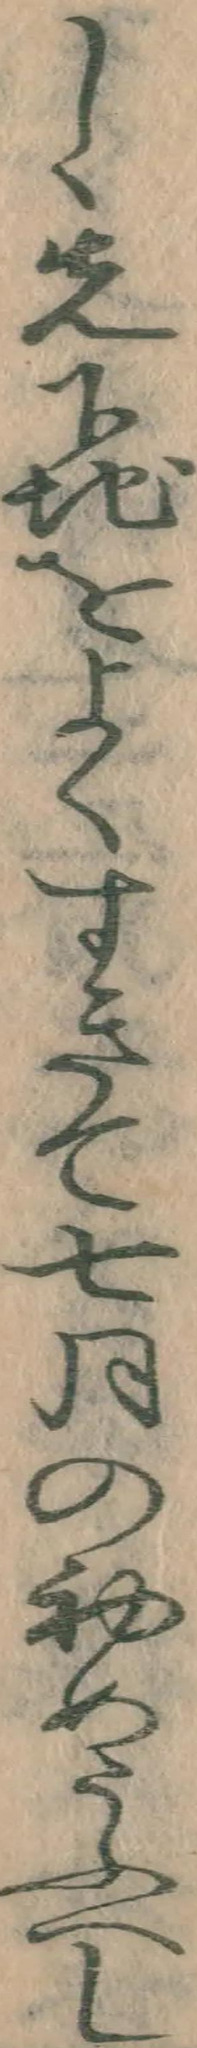しゝ先下地をよくすきて七月の初めうふへし
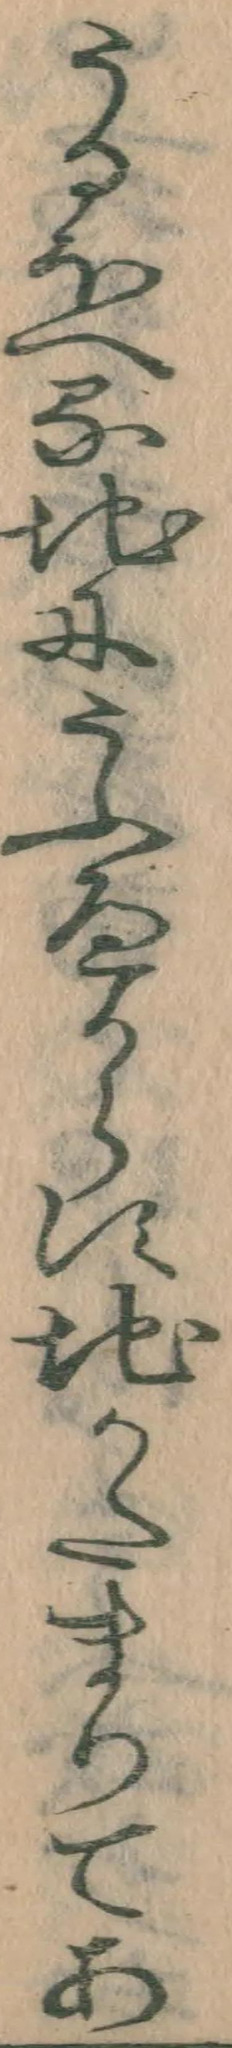うるほへる地にうふへからす地かたまりてあ
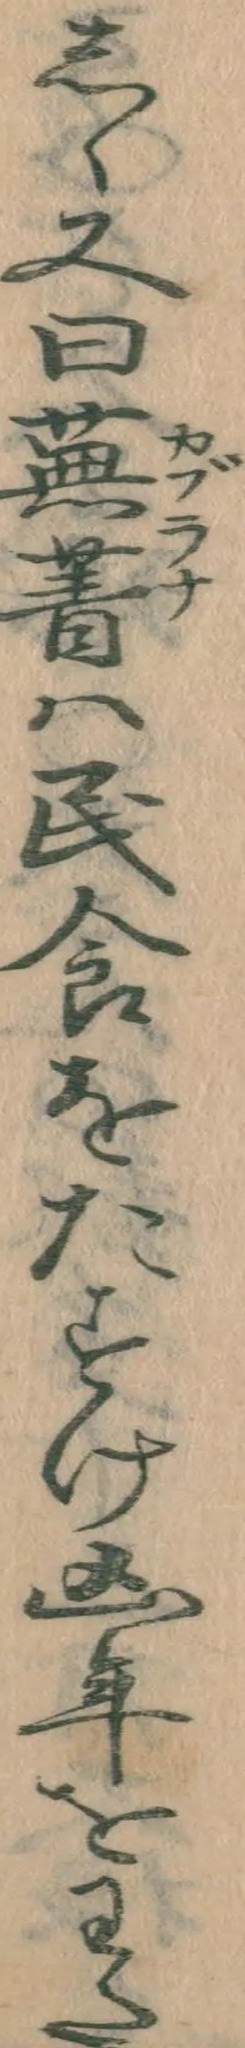しゝ又曰蔓菁は民食をたすけ凶年をわた
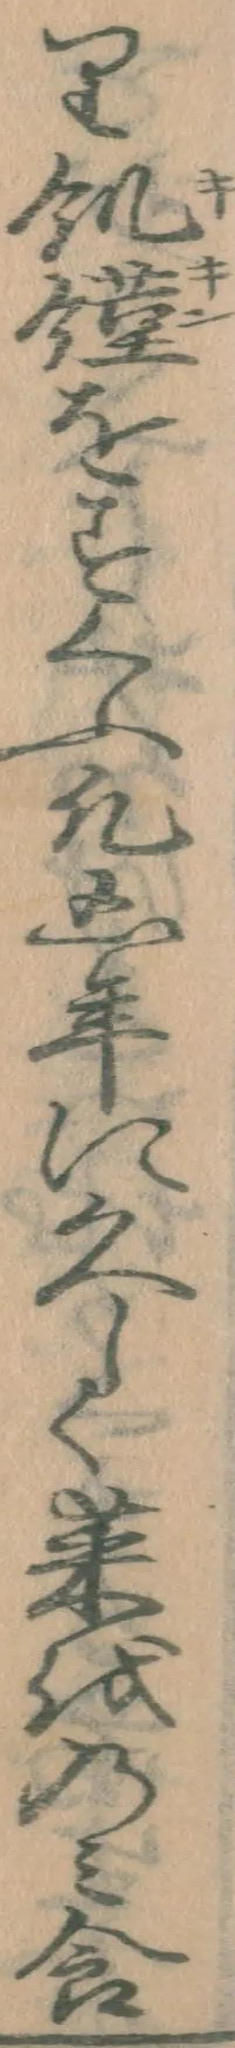り飢饉をすくふ凡凶年に久しく菜をのみ食
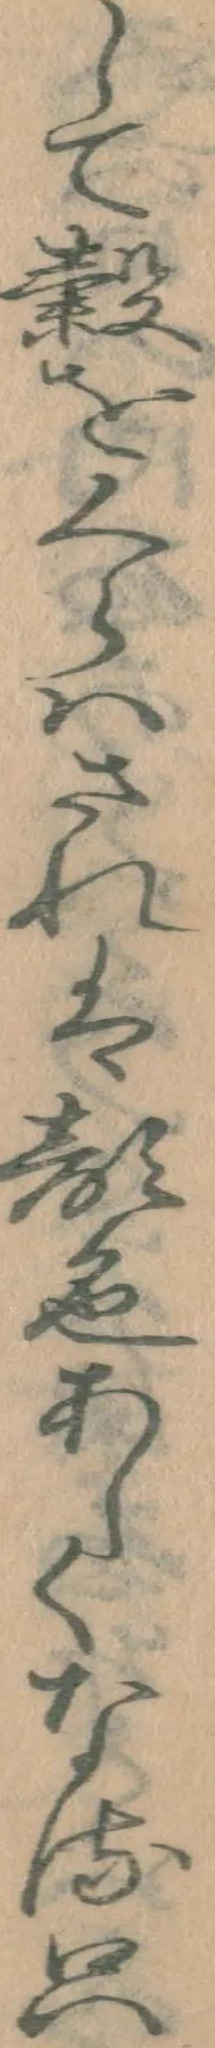して穀をくらはされは顔色あしくなる只
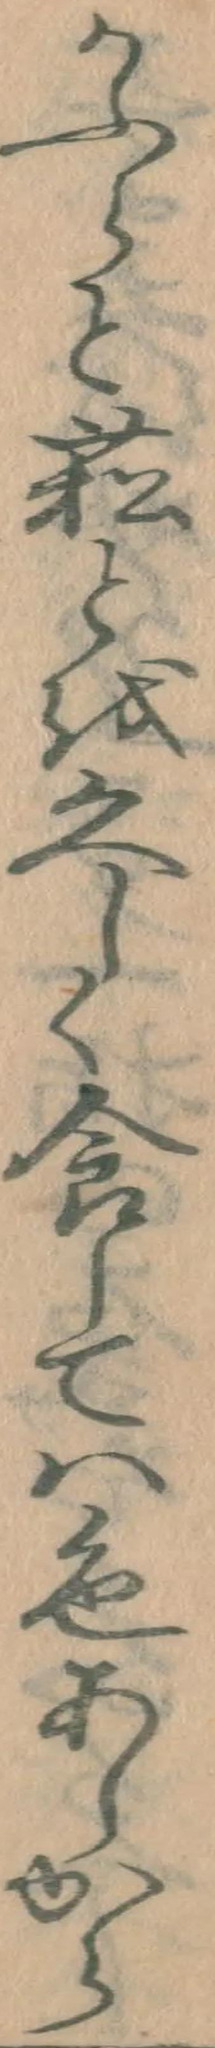かふらと菘とを久しく食しては色あしから
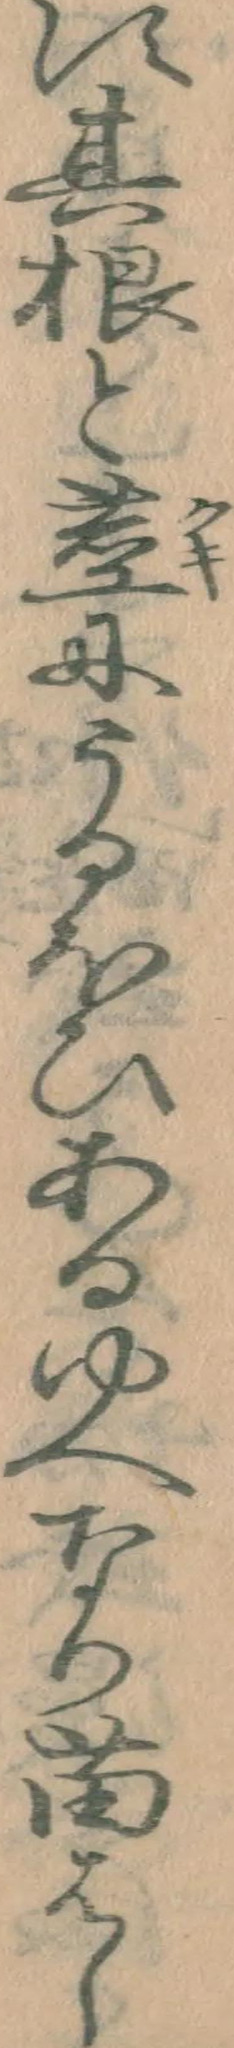す其根と茎にうるほひあるゆへなり苗はし
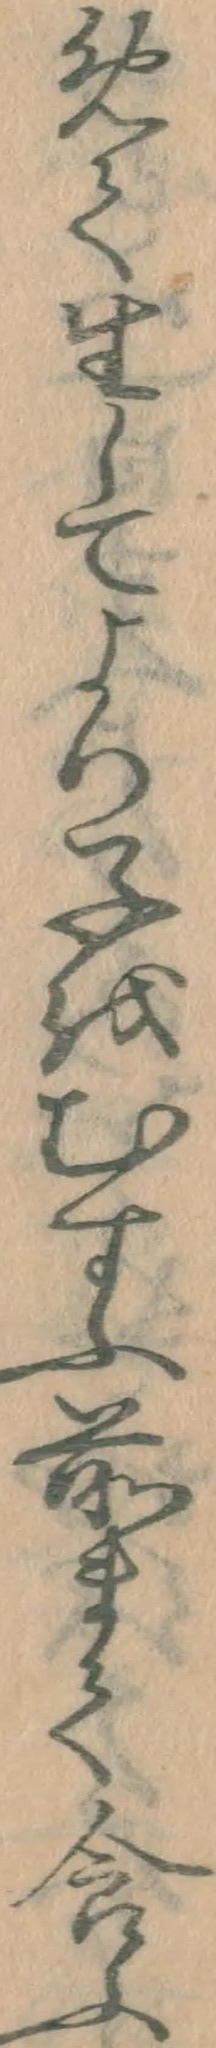めて生してより子をむすふ前まて食ふ
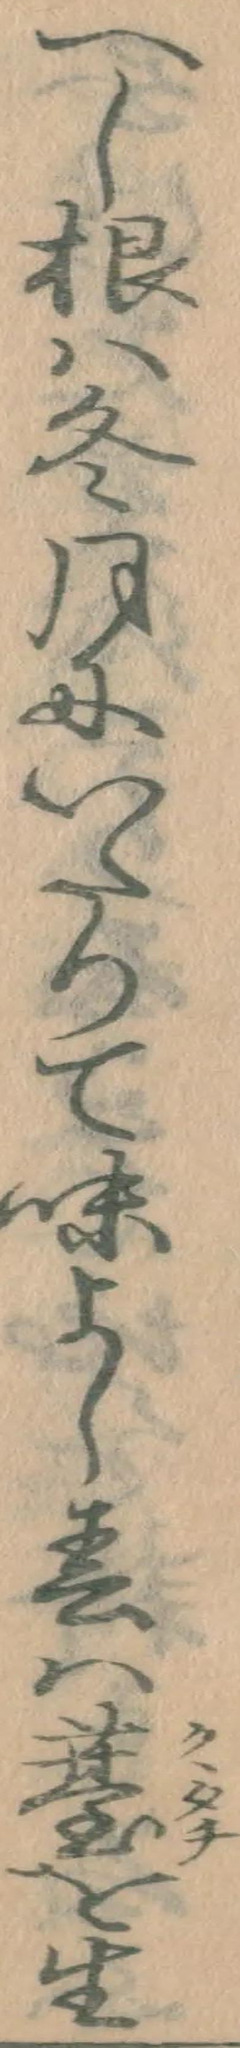へし根は冬月にいたりて味とし春は薹を生
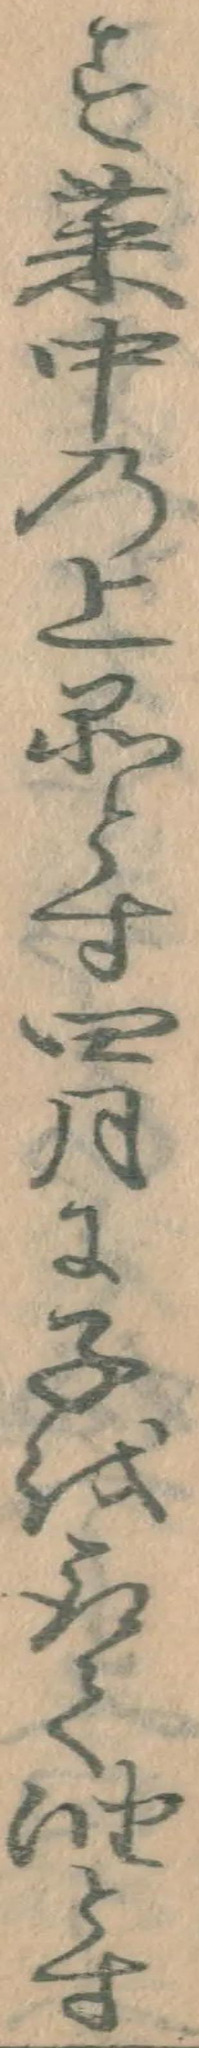す菜中の上品とす四月に子を取て油とす
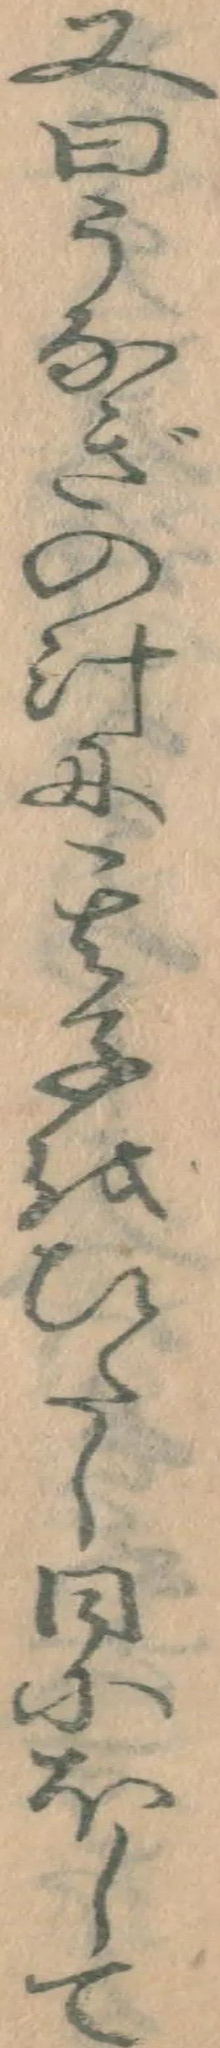又曰うなぎの汁に其子をひたし日にほして
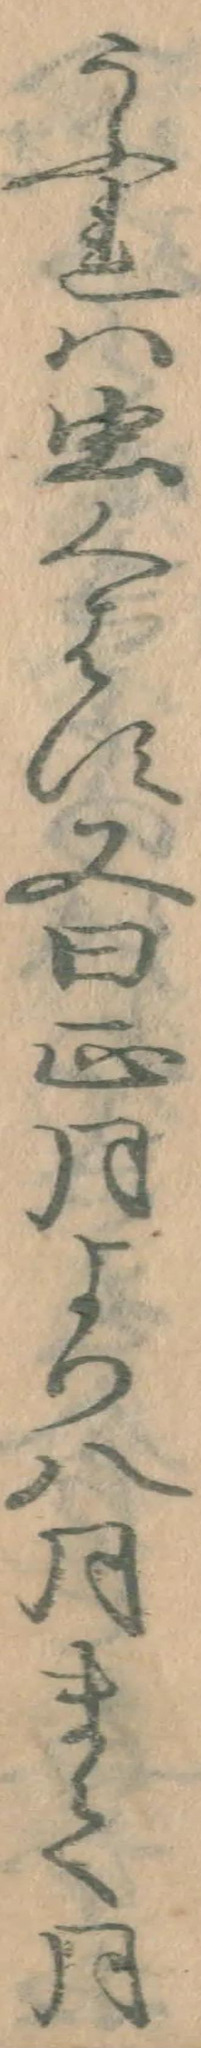うふれは虫くはす又曰正月より八月まて月
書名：菜譜 3巻
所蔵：国立国会図書館 National Diet Library, JAPAN
